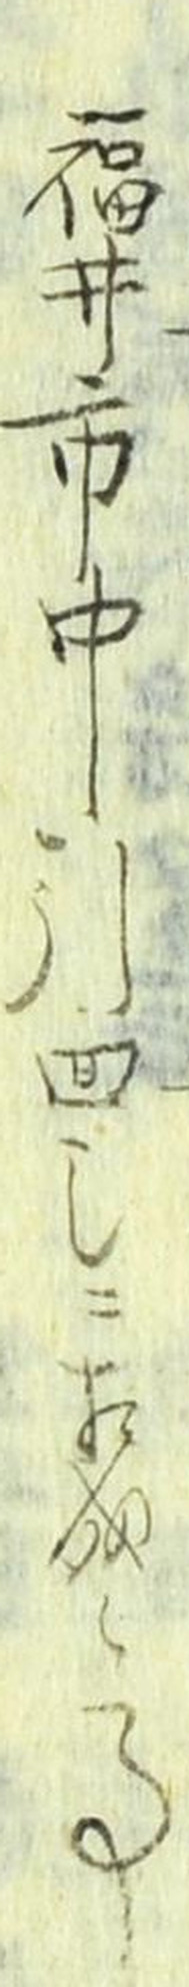福井市中引回しニ相成候事

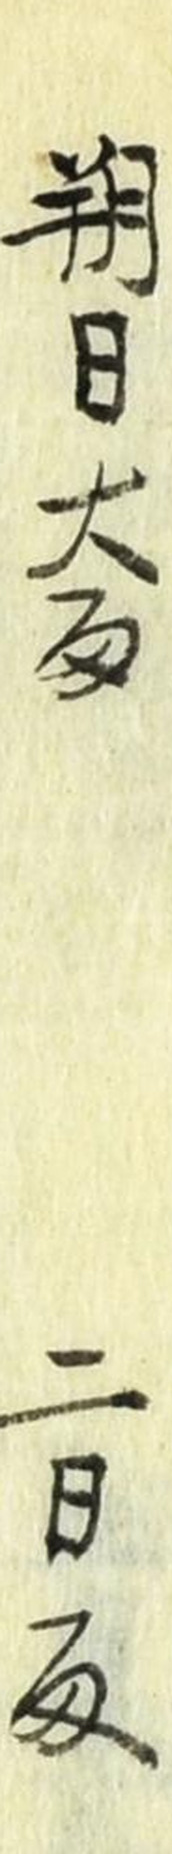朔日大雨二日雨
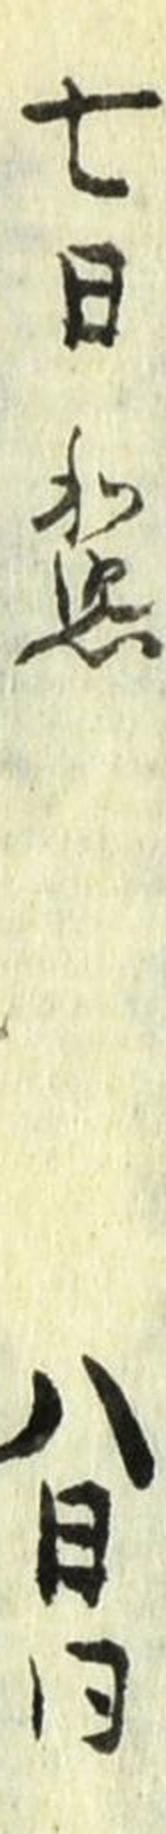七日和照八日同
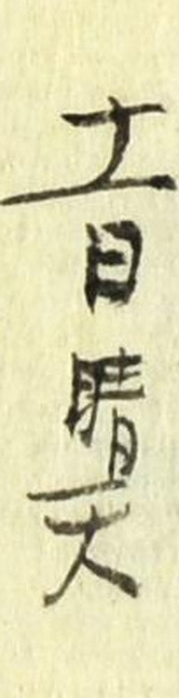十二日晴天
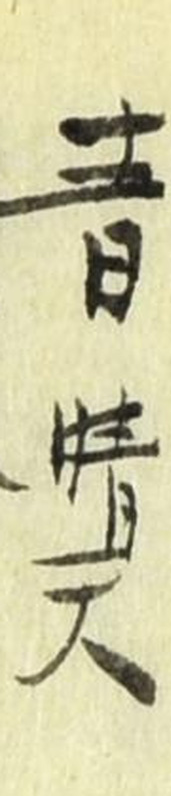十二日晴天
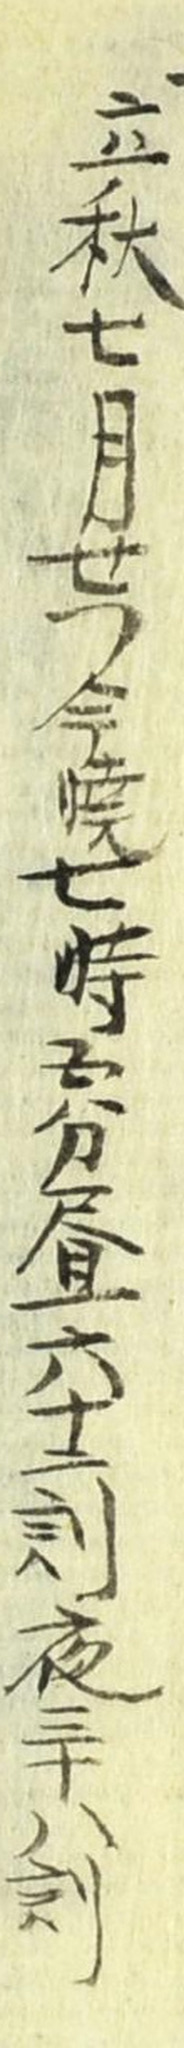立秋七月せつ今暁七時五分昼六十二刻夜三十八刻
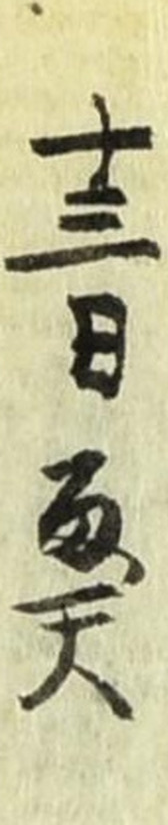十二日晴天
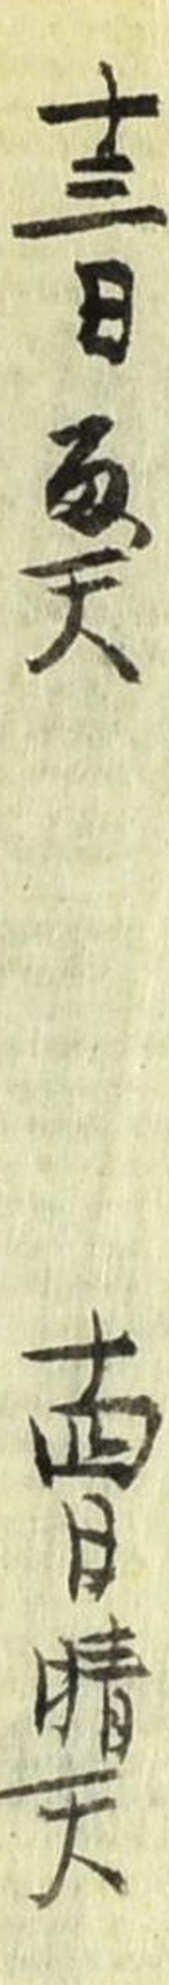十三日雨天十四日晴天
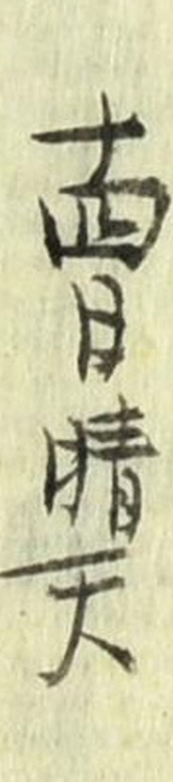十二日晴天
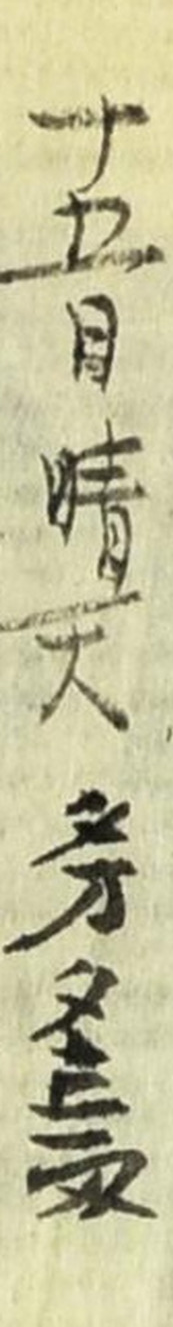十五日晴天夕方夕立雨
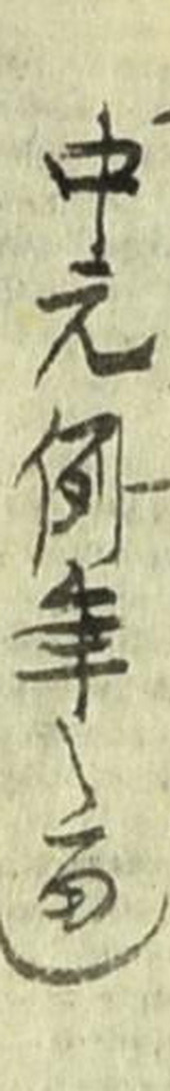中元例年之通
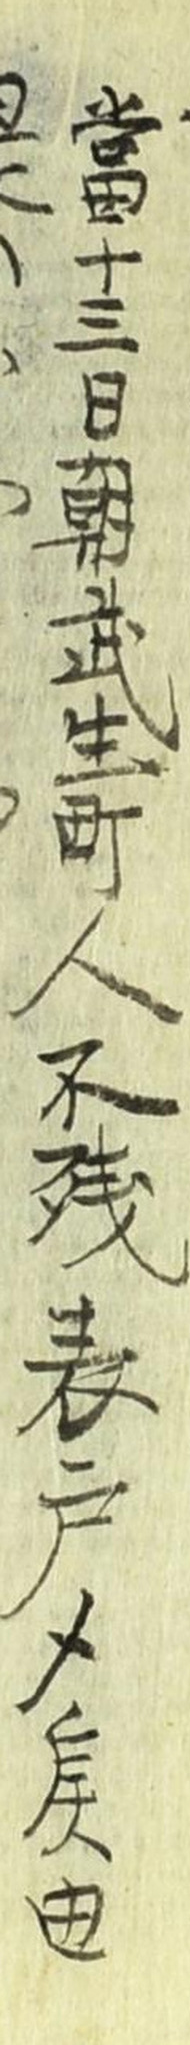当十三日朝武生町人不残表戸〆候由
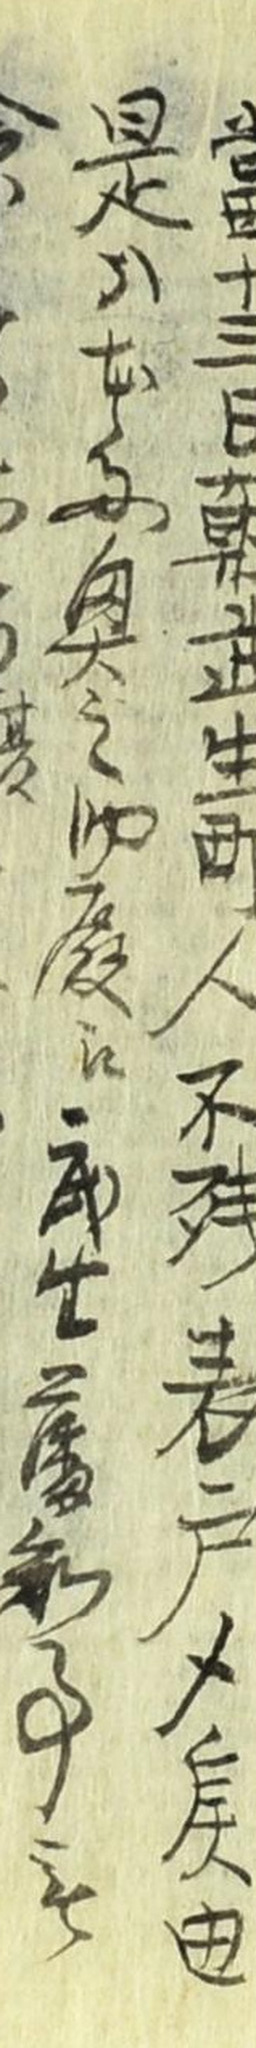是ハ本多興之助殿江武生藩知事被
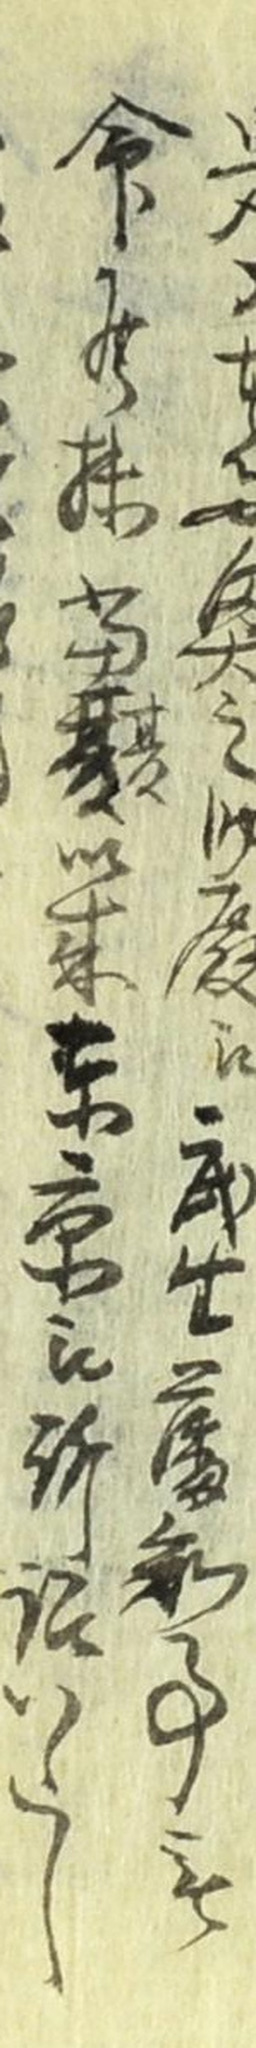命候様当夏以来東京江訴訟いたし
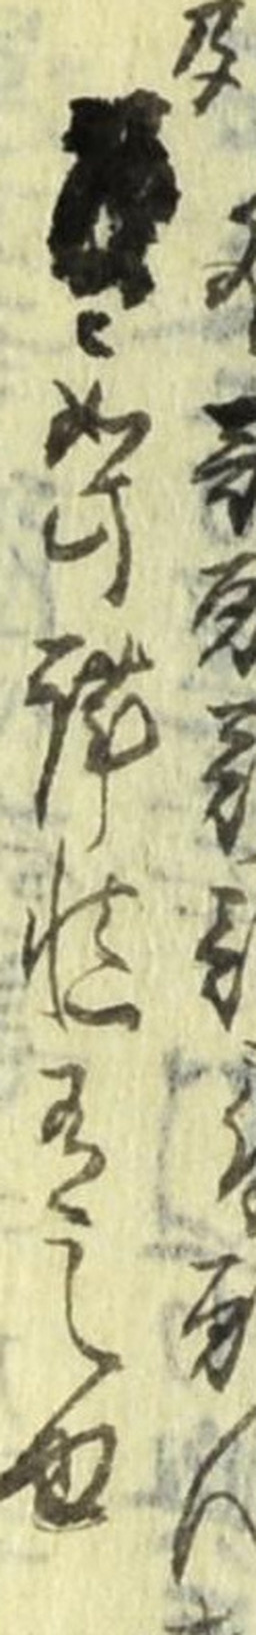及ヒ如此謹慎有之由
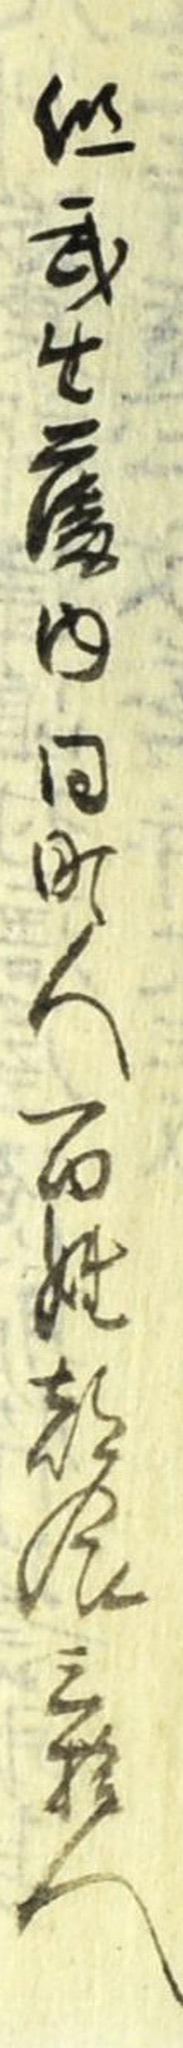但武生藩内同町人百姓都合三拾人
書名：（日記）
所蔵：福井県文書館 Fukui Prefectural Archives
